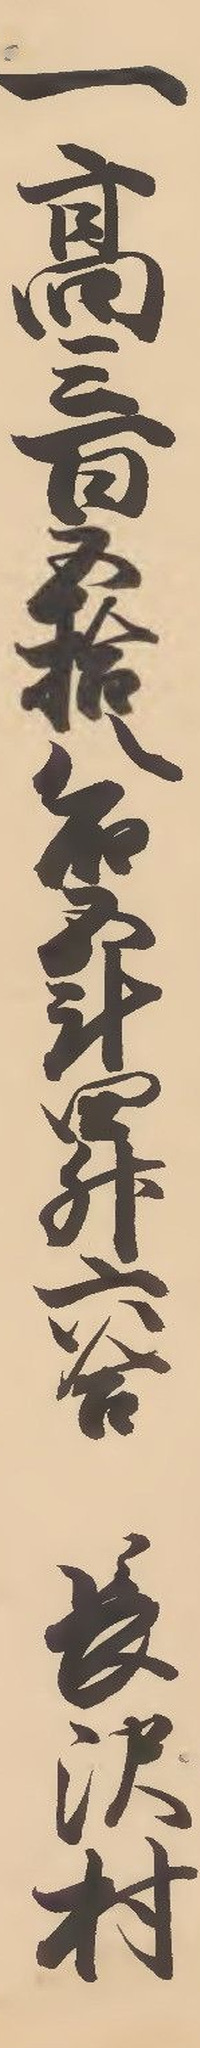一高三百五拾八石五斗四升六合長沢村
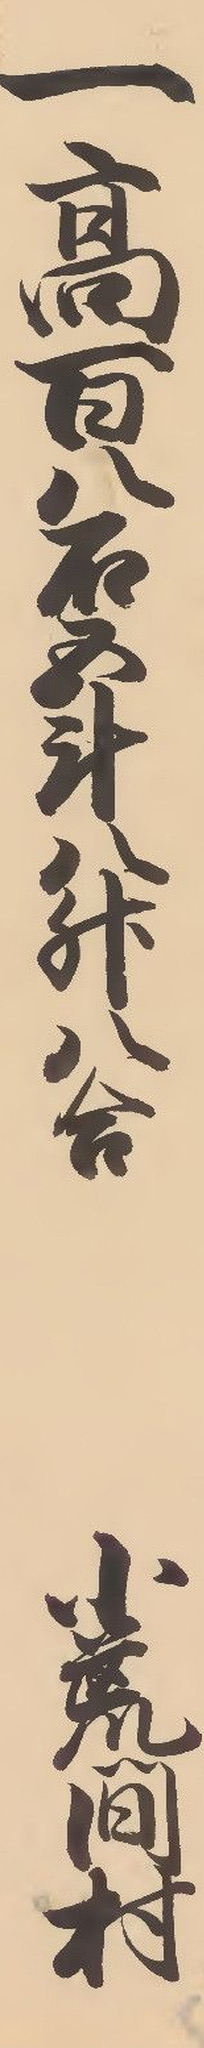一高百八石五斗八升八合小荒間村
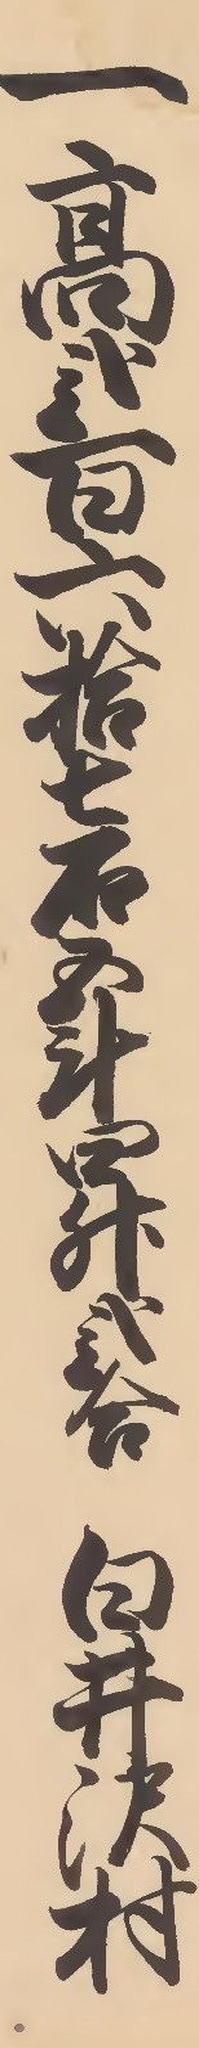一高弐百六拾七石五斗四升弐合白井沢村

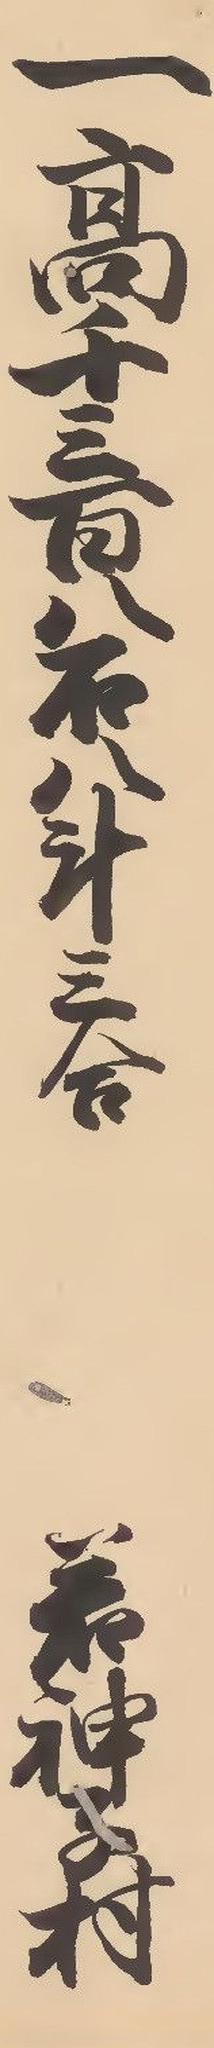一高千三百八石八斗三合若神子村
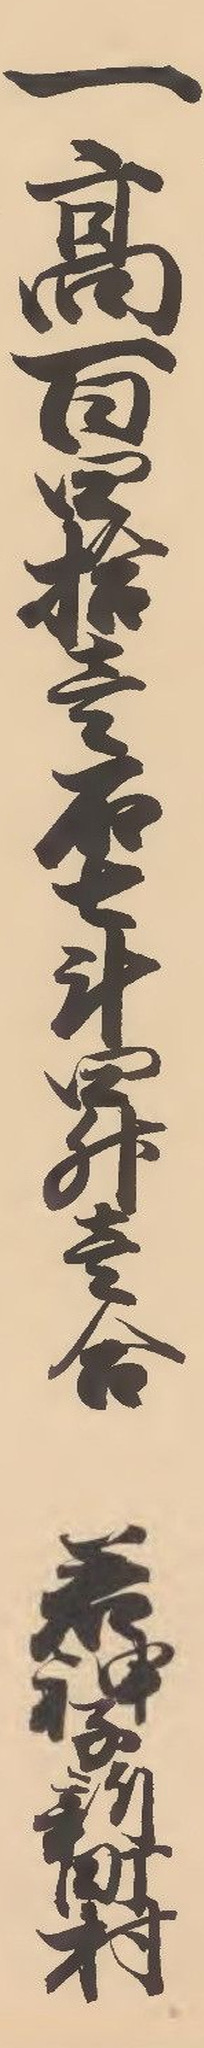一高百四拾壱石七斗四升壱合若神子新町村
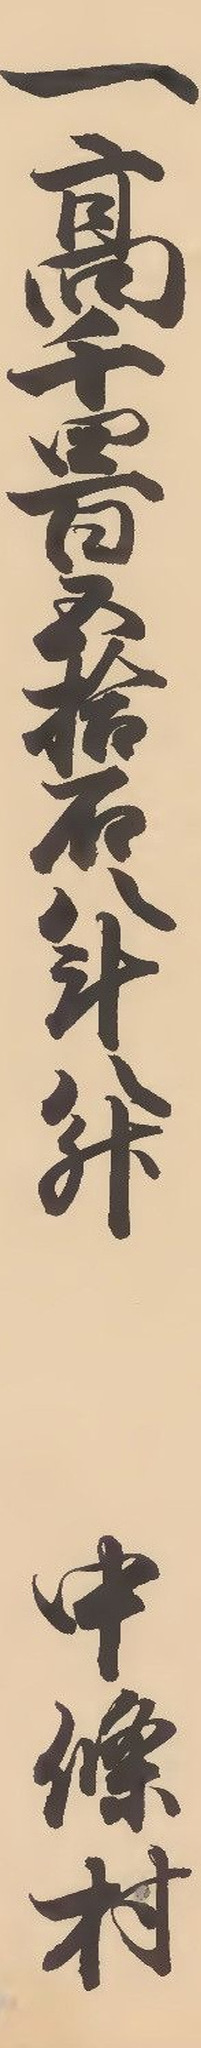一高千四百五拾石八斗八升中条村
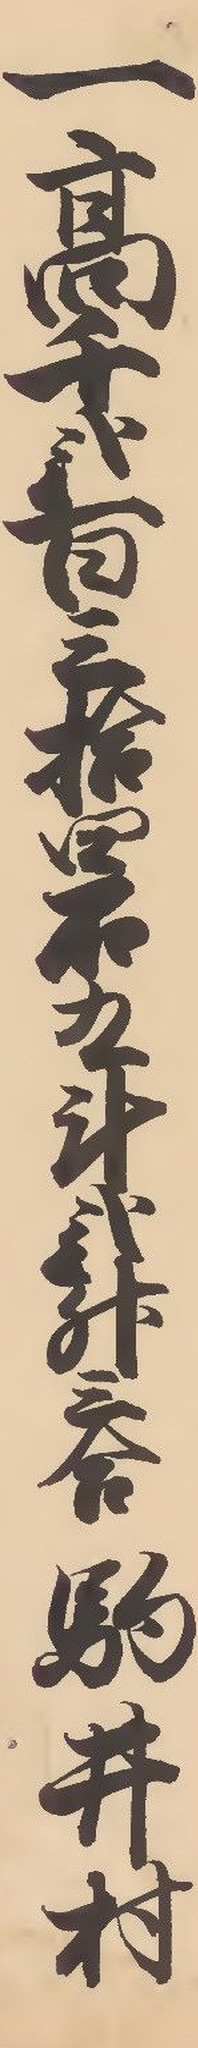一高千弐百三拾四石九斗弐升三合駒井村
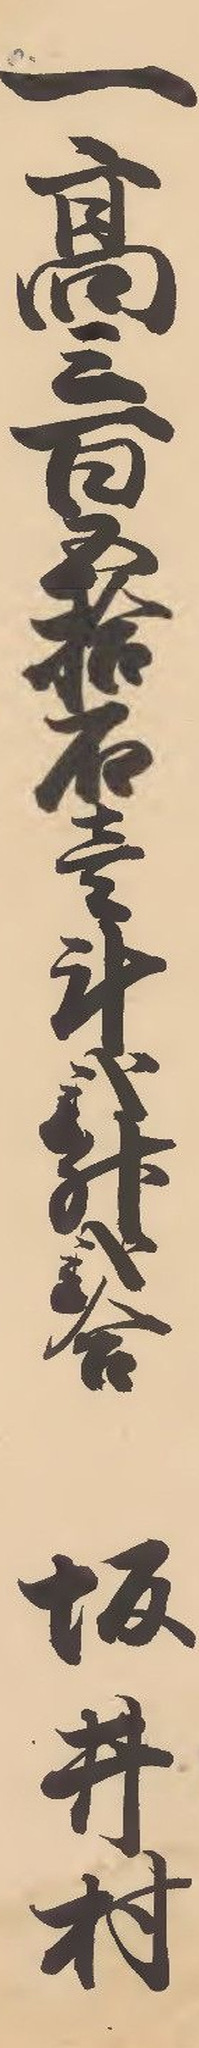一高三百五拾石壱斗弐升弐合坂井村
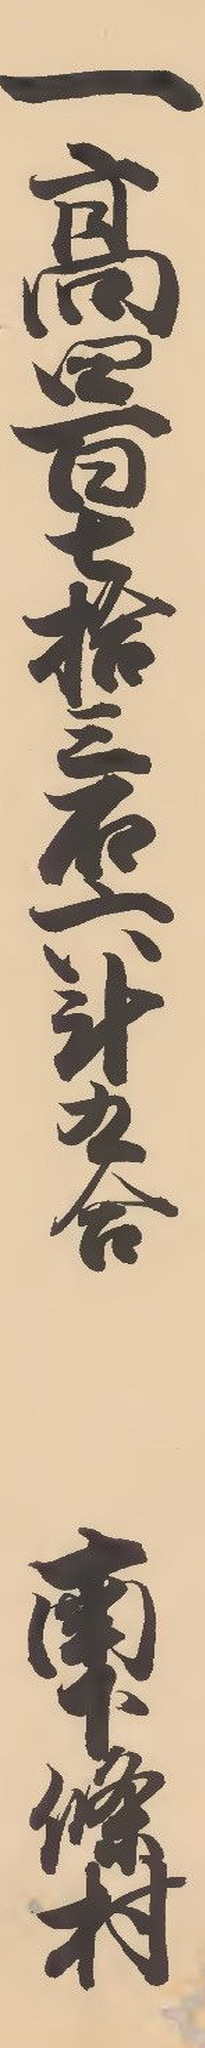一高四百七拾三石六斗九合南下条村
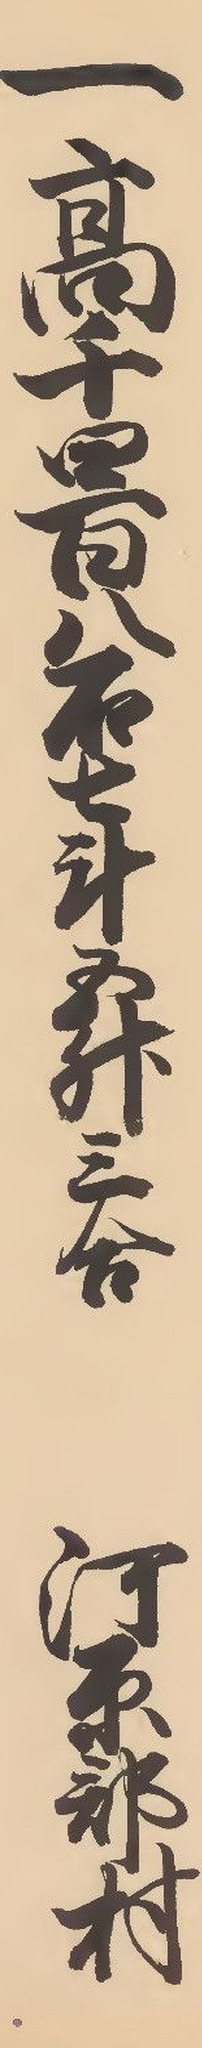一高千四百八石七斗五升三合河原部村
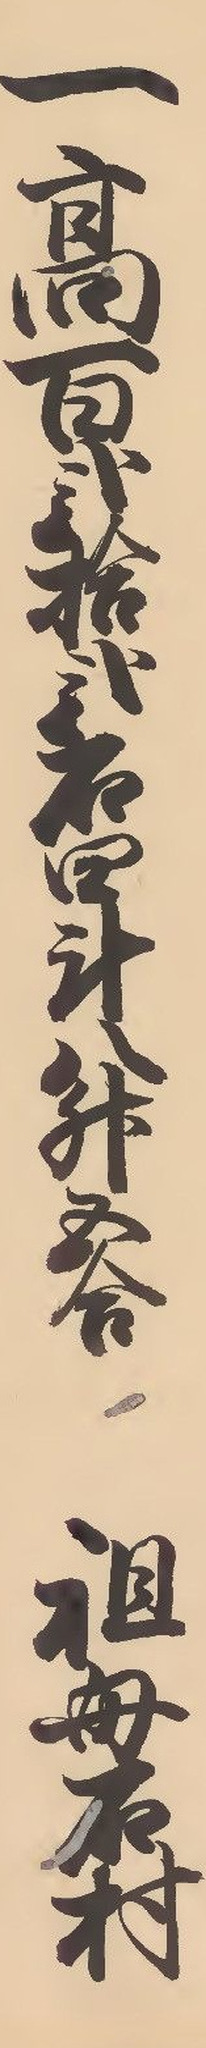一高百弐拾弐石四斗八升五合祖母石村

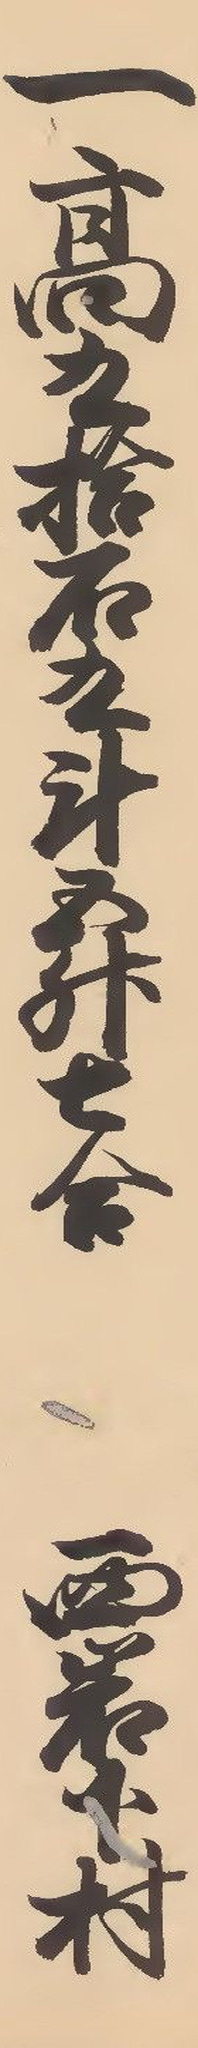一高九拾石九斗五升七合西岩下村
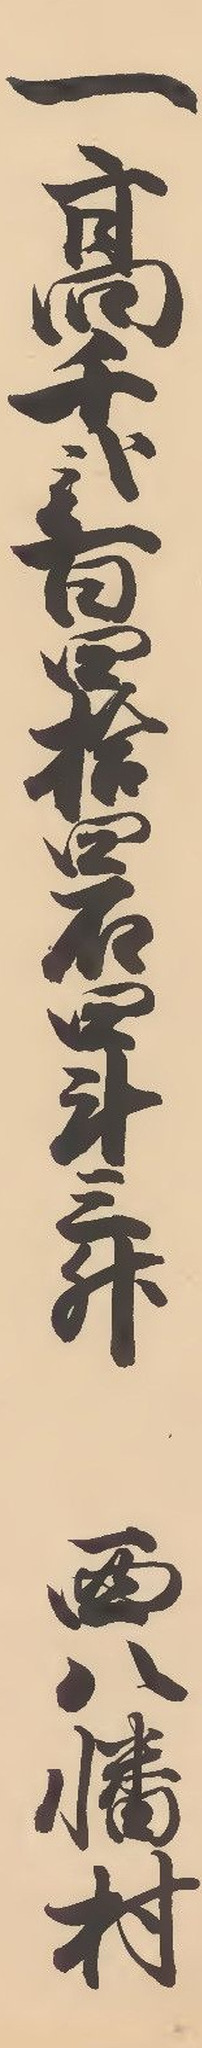一高千弐百四拾四石四斗三升西八幡村
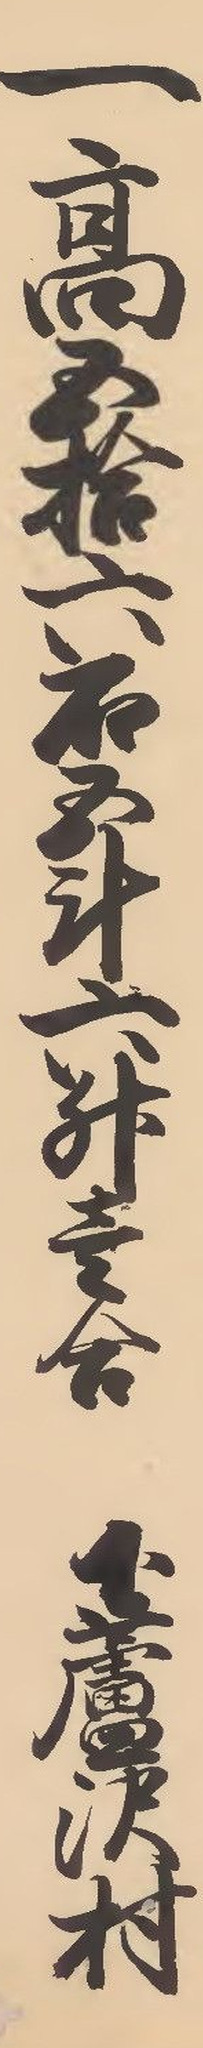一高五拾六石五斗六升壱合下蘆沢村
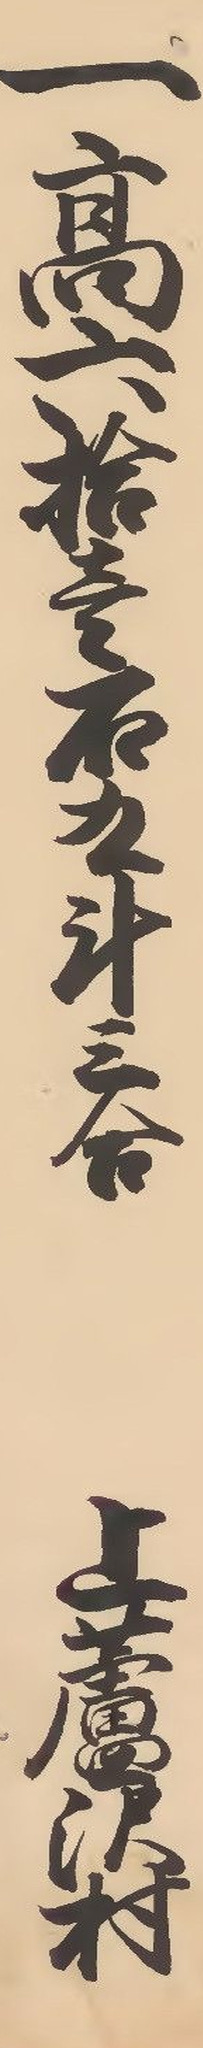一高六拾壱石九斗三合上蘆沢村
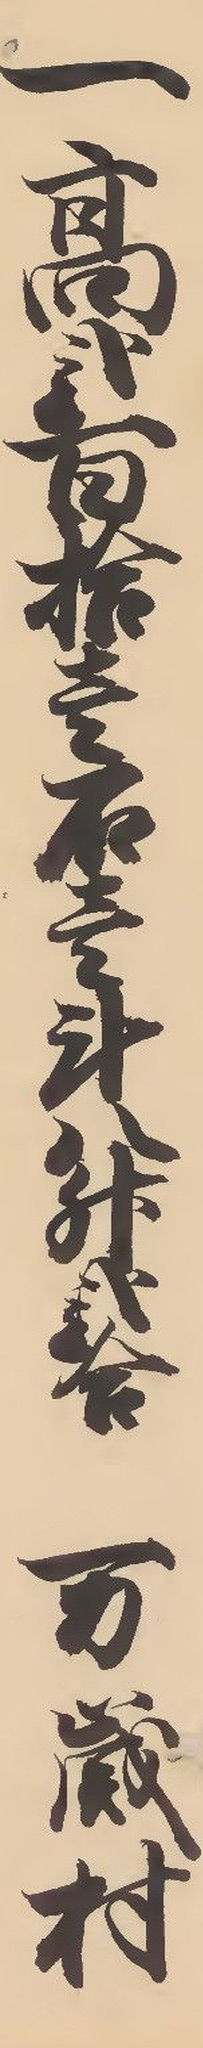一高弐百拾壱石壱斗八升弐合万歳村
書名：甲斐国郷帳
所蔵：国立公文書館 National Archives of Japan
